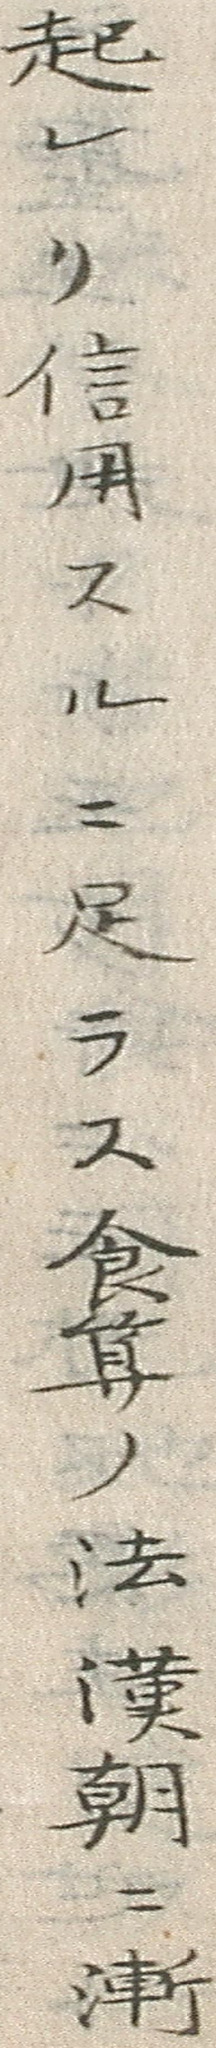起レリ信用スルニ足ラス食算ノ法漢朝ニ漸
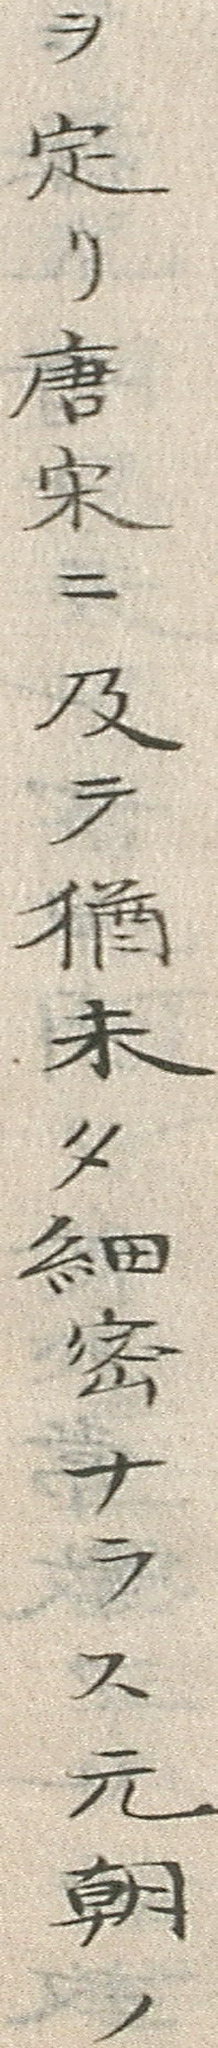ヲ定リ唐宋ニ及テ猶未タ細密ナラス元朝ノ
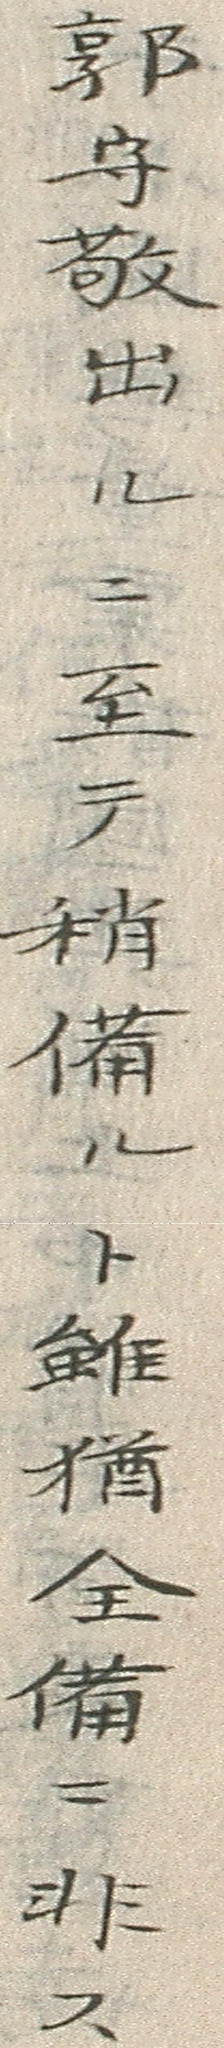郭守敬出ルニ至テ稍備ルト雖猶全備ニ非ス
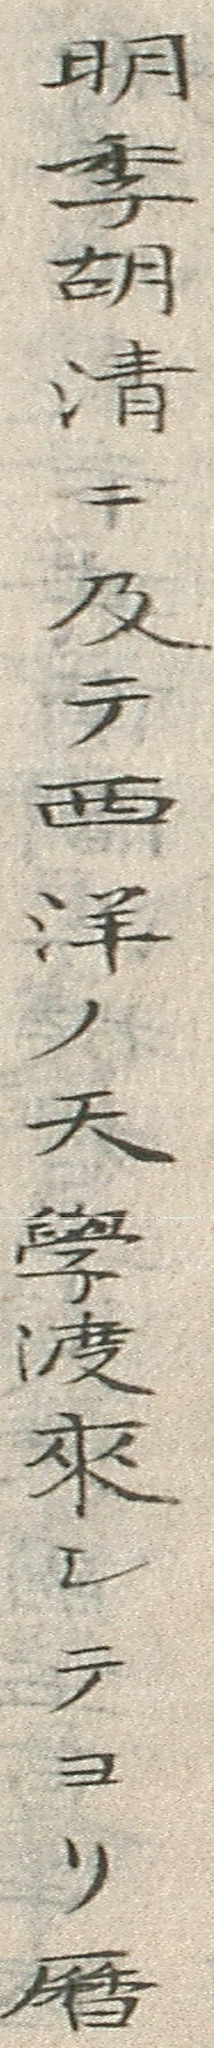明季胡清ニ及テ西洋ノ天学渡来シテヨリ暦
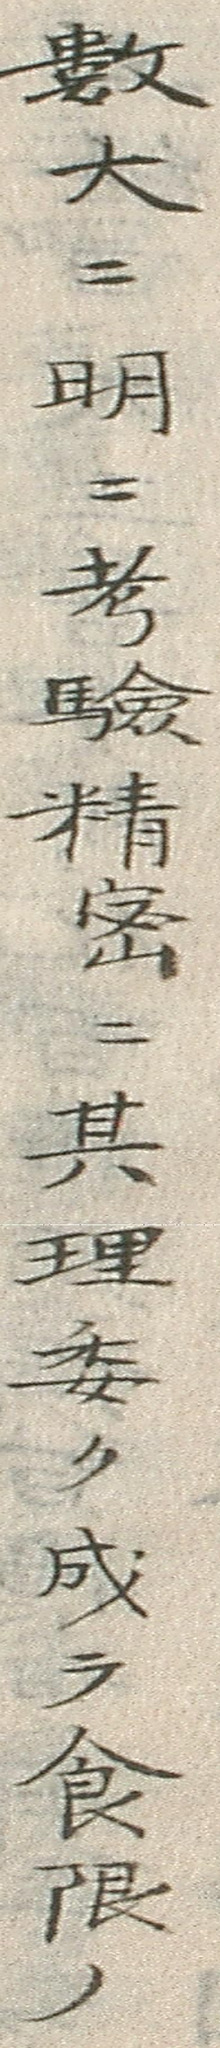数大ニ明ニ考験精密ニ其理委ク成テ食限ノ
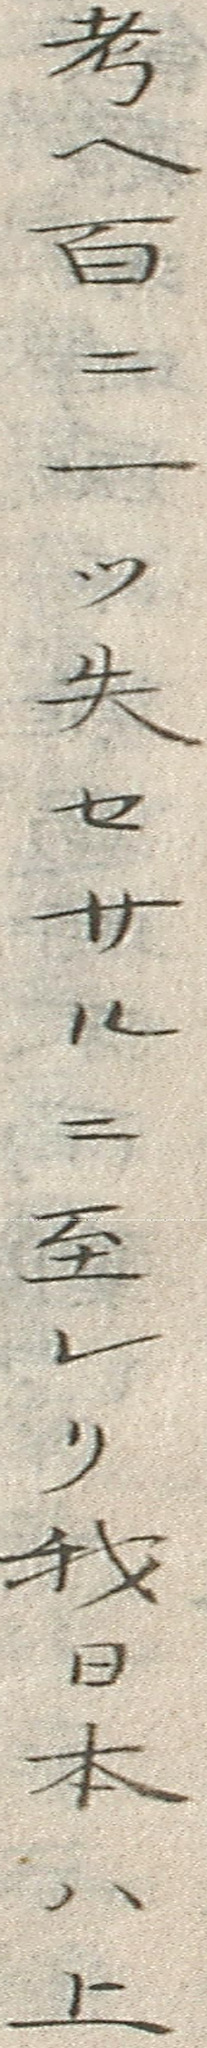考ヘ百ニ一ッ失セサルニ至レリ我日本ハ上
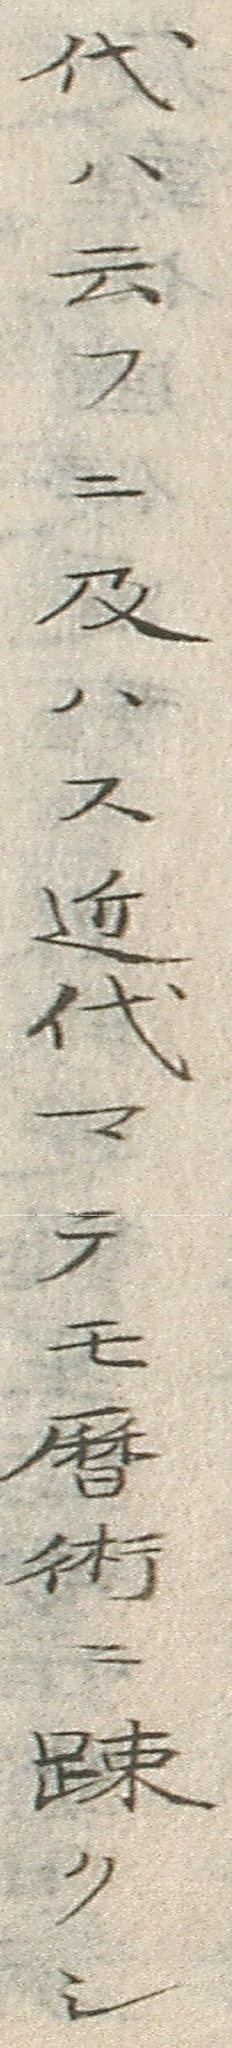代ハ云フニ及ハス近代マテモ暦術ニ疎クシ
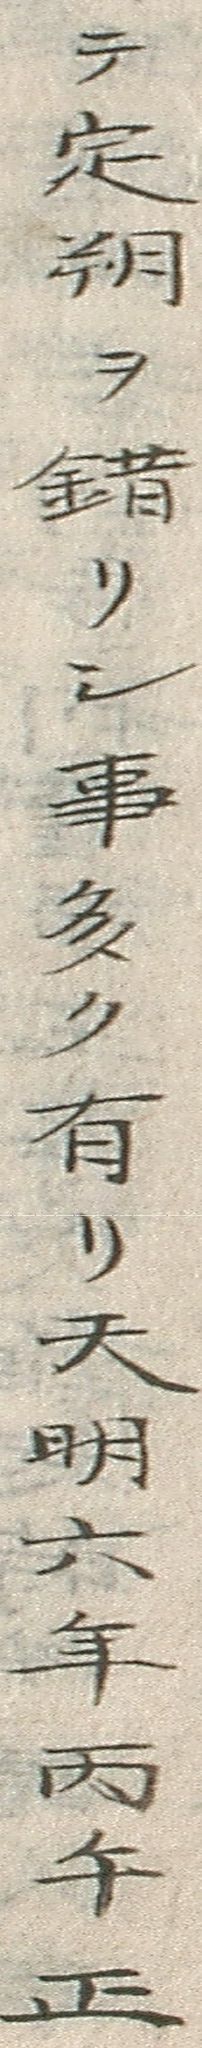テ定朔ヲ錯リシ事多ク有リ天明六年丙午正
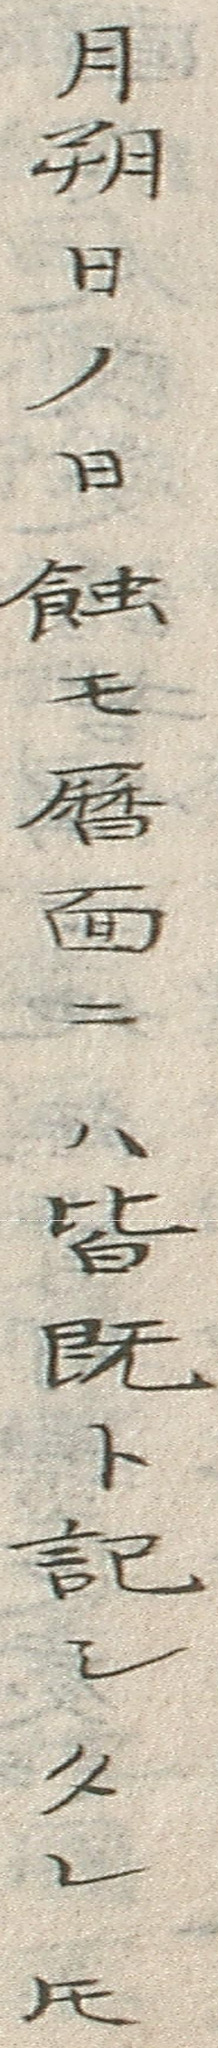月朔日ノ日蝕モ暦面ニハ皆既ト記シタレトモ
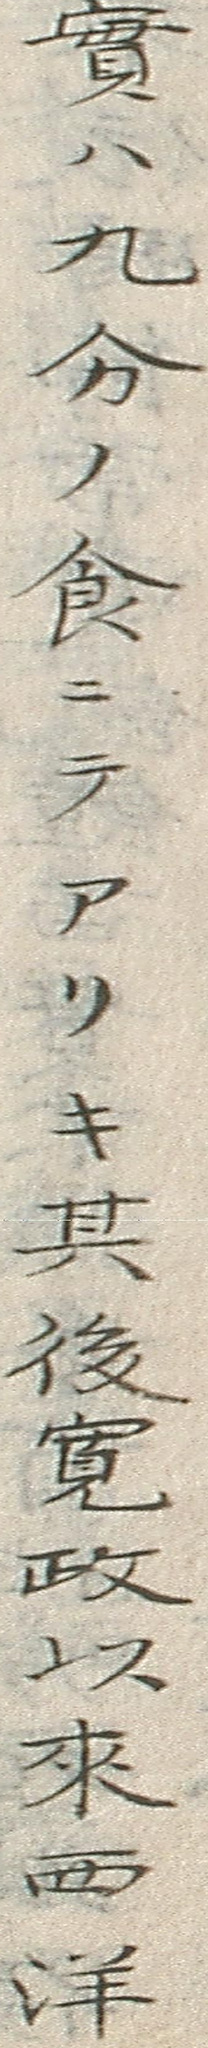実ハ九分ノ食ニテアリキ其後寛政以来西洋
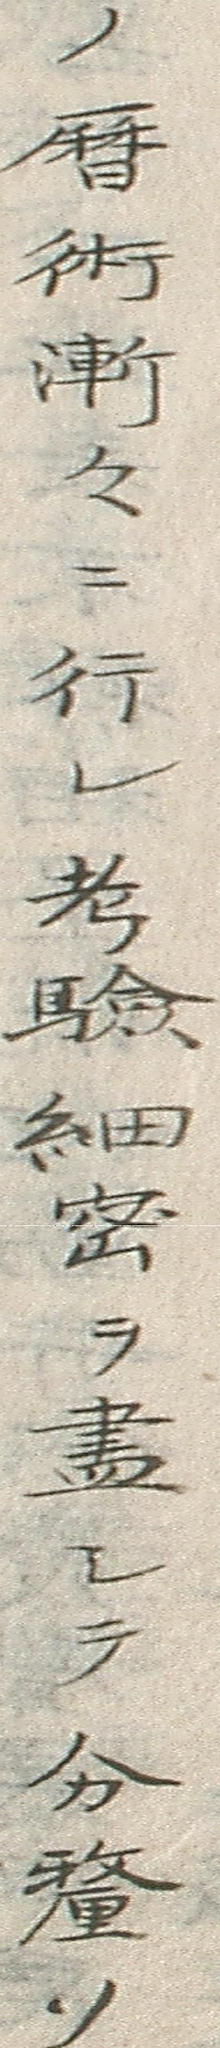ノ暦術漸々ニ行レ考験細密ヲ尽シテ分釐ソ
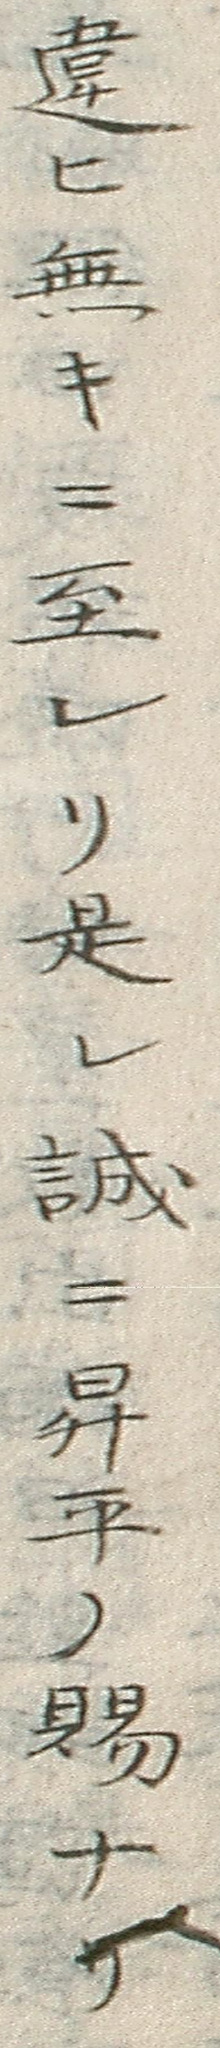違ヒ無キニ至レリ是レ誠ニ昇平ノ賜ナリ

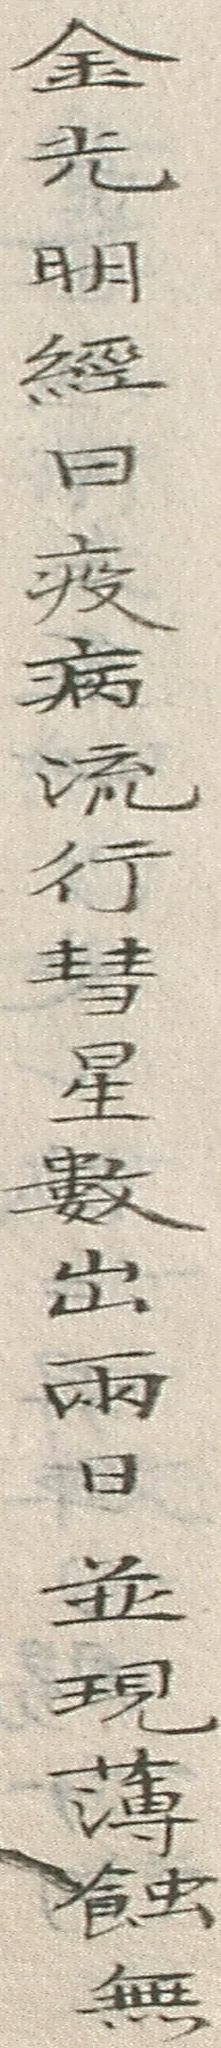金光明経曰疫病流行彗星数出雨日並現薄蝕無
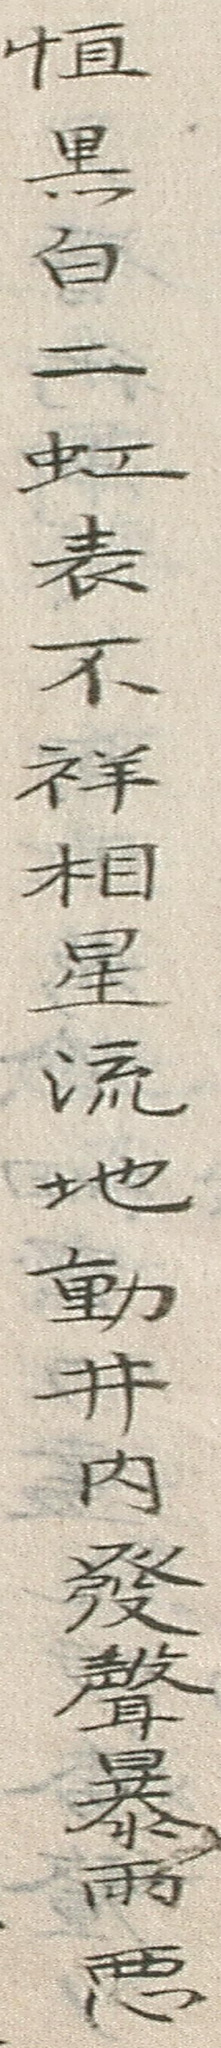恒黒白二虹表不詳相星流地動井内発声暴雨悪
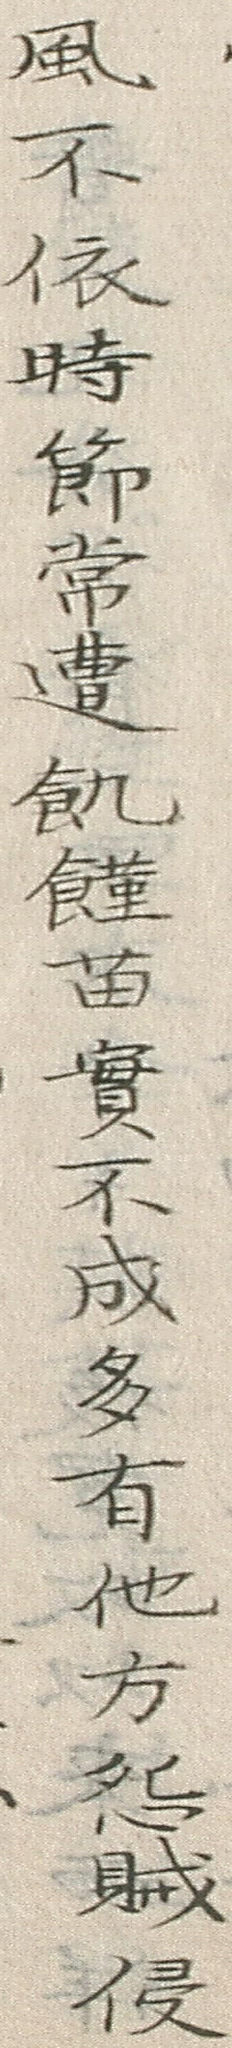風不依時節常遭飢饉苗実不成多有他方怨賊侵
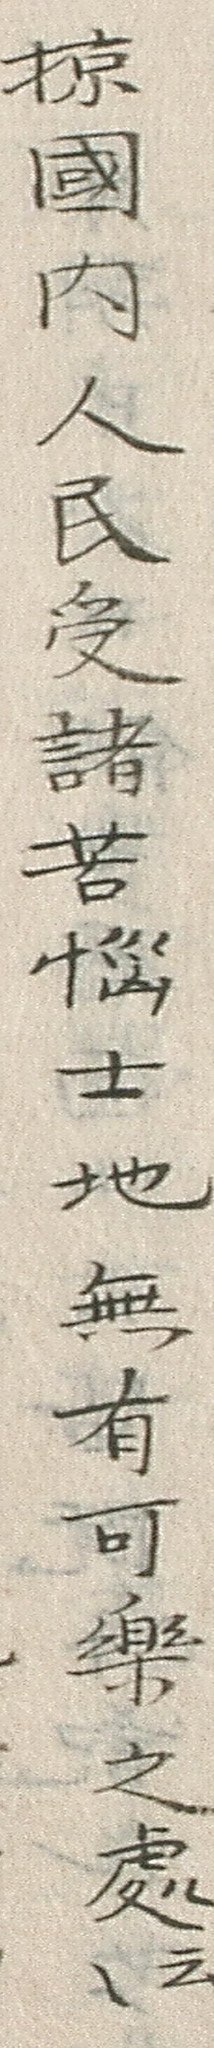掠国内人民受諸苦悩士地無有可楽之処云〻
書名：天學略名目羽翼　全
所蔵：東京大学地震研究所図書室 Earthquake Research Institute Library, The University of Tokyo, JAPAN
